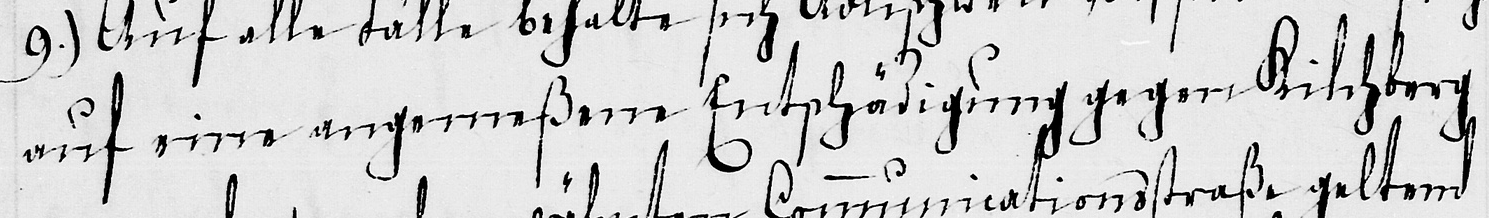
auf eine angemeßene Entschädigung gegen Kilchberg
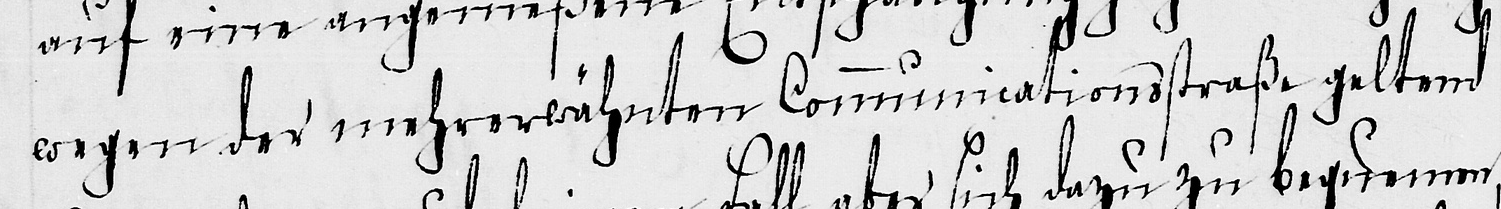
wegen der mehrerwähnten Communicationsstraße geltend
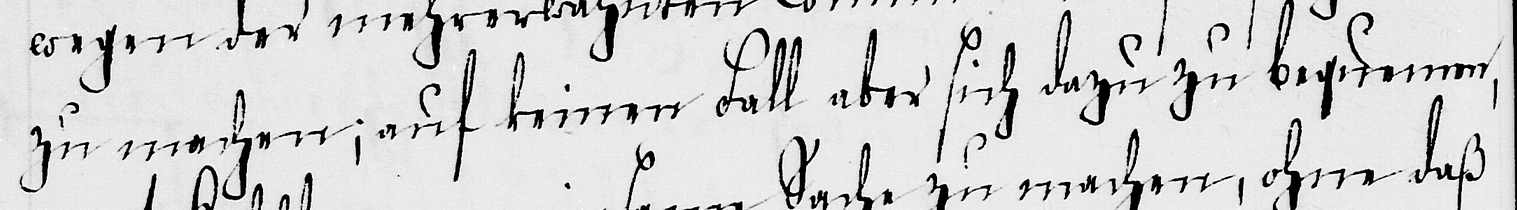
zu machen; auf keinen Fall aber sich dazu zu bequemen,
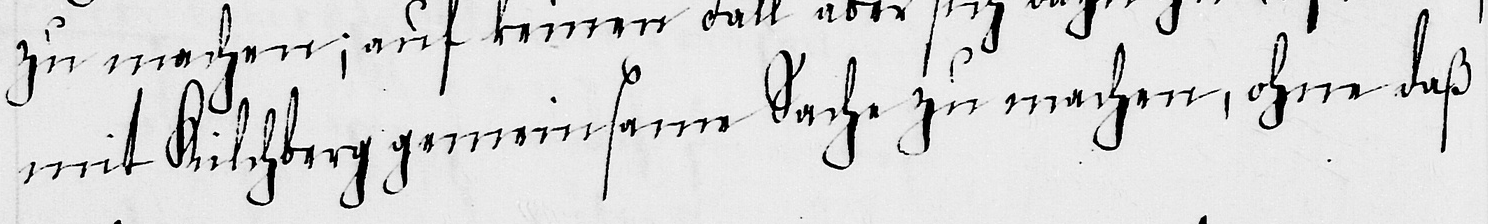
mit Kilchberg gemeinsame Sache zu machen, ohne daß
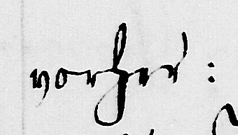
vorher:
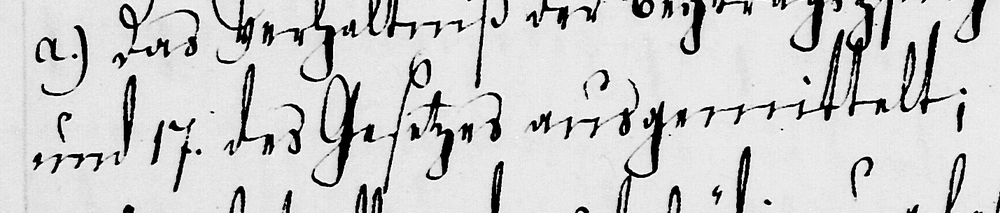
und 17. des Gesetzes ausgemittelt;
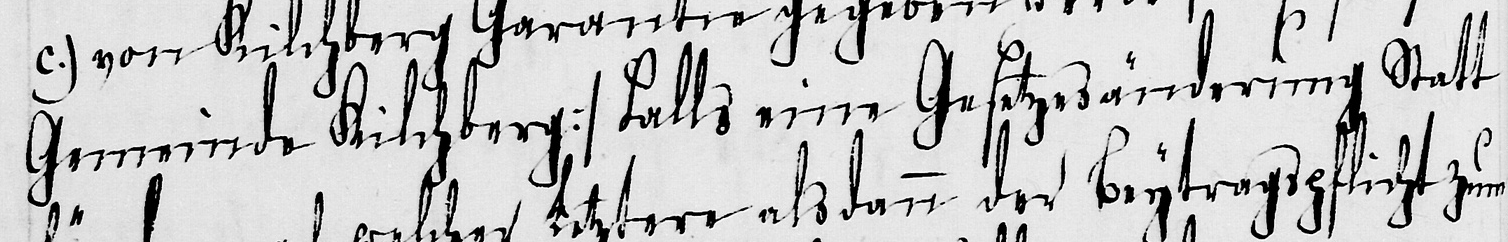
Gemeinde Kilchberg :/ Falls eine Gesetzesänderung Statt
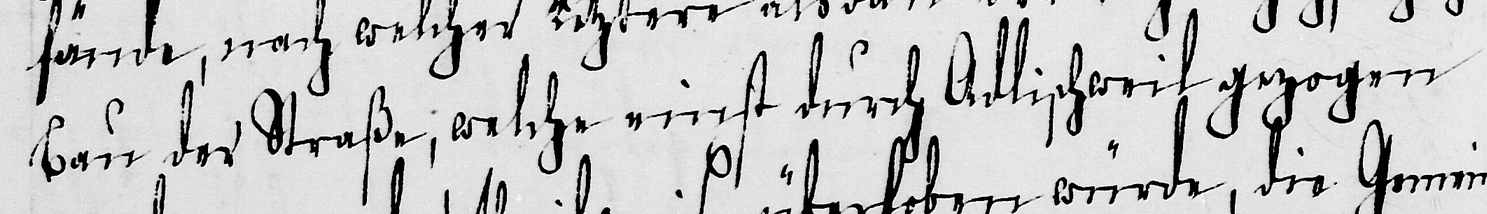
Bau der Straße, welche nicht durch Adlischweil gezogen
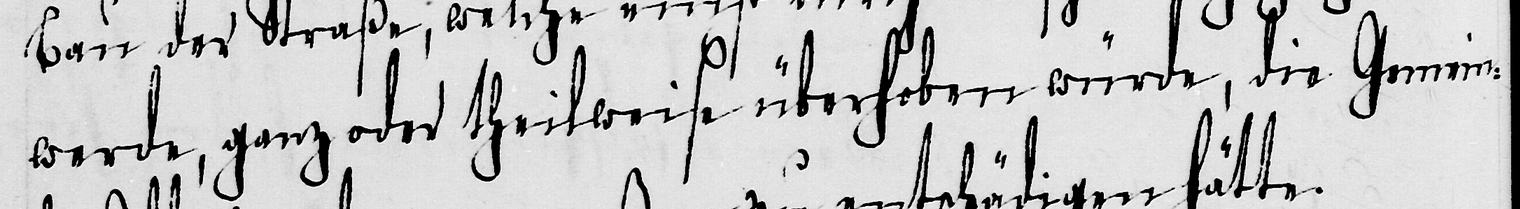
werde, ganz oder theilweise überhoben würde, die Gemein¬
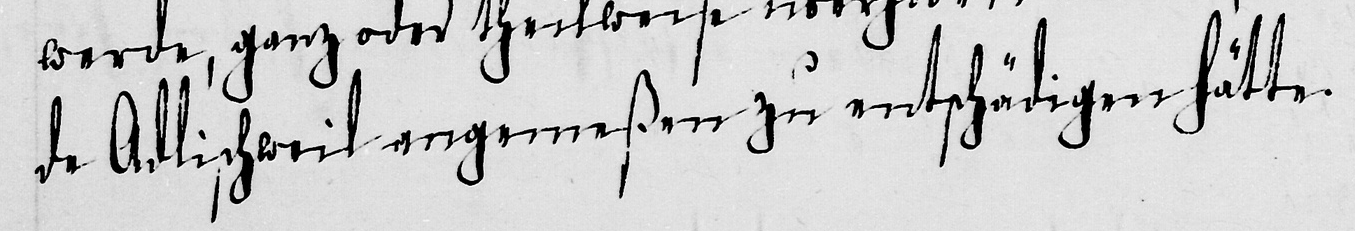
de Adlischweil angemeßen zu entschädigen hätte.
